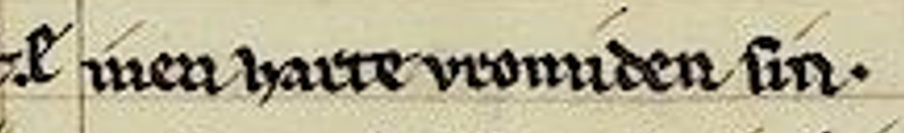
Einen harte vromiden ſin.
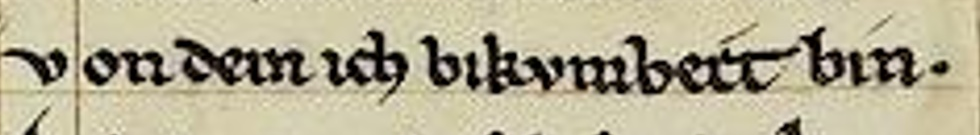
Von dem ich bikvmbert bin.
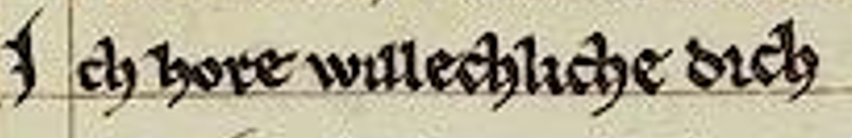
Ich hore willechliche dich
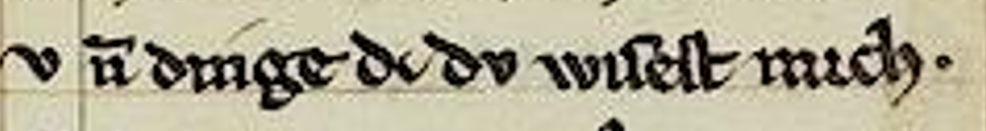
Vn(d) dinge d(az) dv wiſeſt mich.
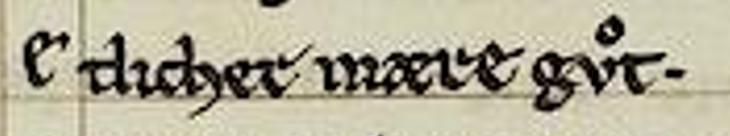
Etlicher m[ae]re gv°ot.
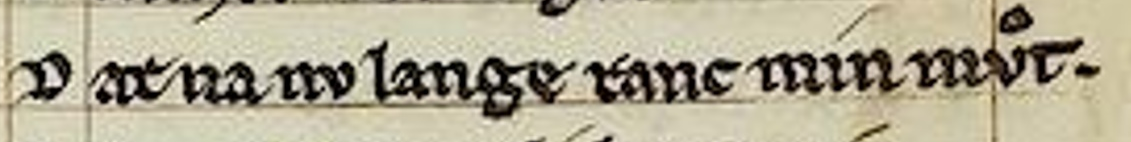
Dar na nv lange ranc min mv°ot.
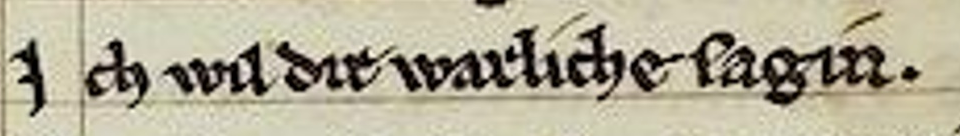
Ich wil dir warliche ſagin.
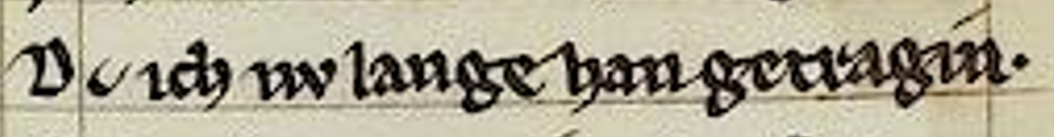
D(az) ich nv lange han getragin.
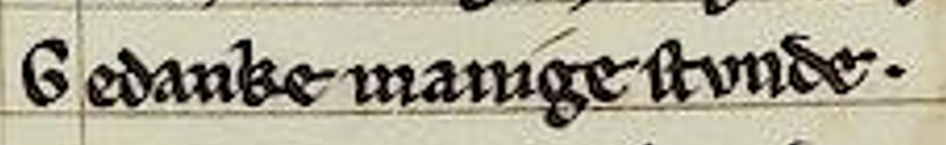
Gedanke manige ſtvnde.
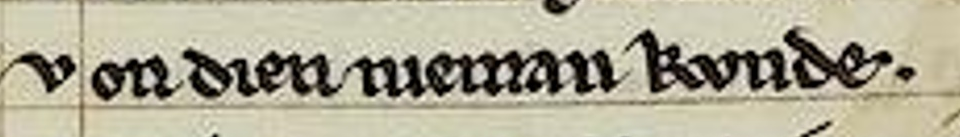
Von dien nieman kvnde.
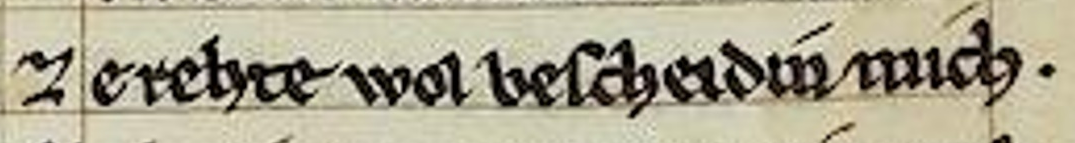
Ze rehte wol beſcheidin mich.
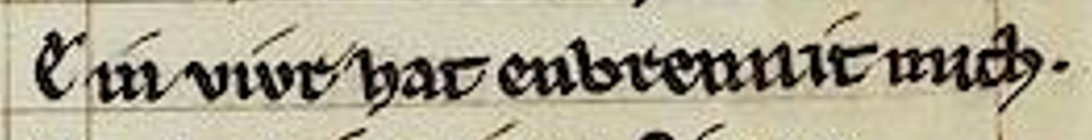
Ein vivr hat enbrennit mich.
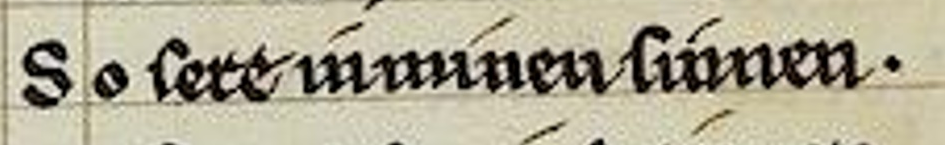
So ſere in minen ſinnen.
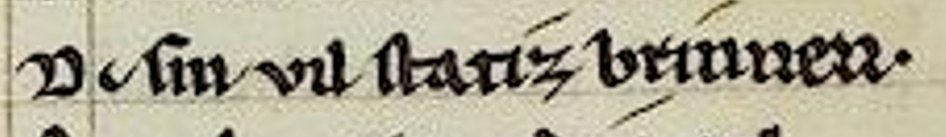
D(az) ſin vil ſtatiz brinnen.
